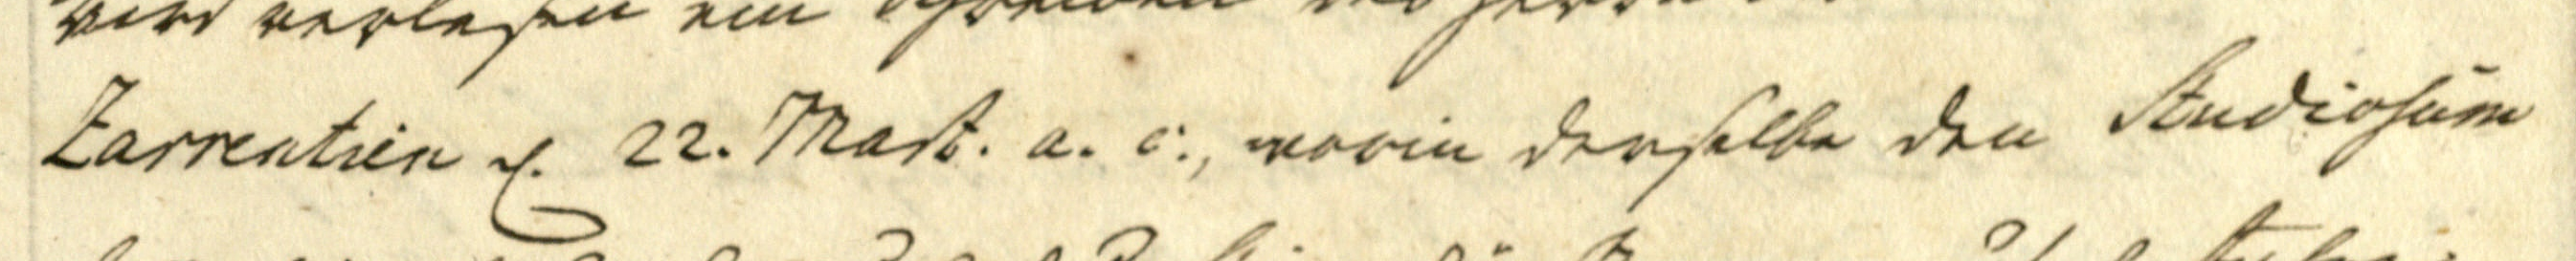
Zarrentien l. 22. Mart. a. c., worin derselbe den Studiosum
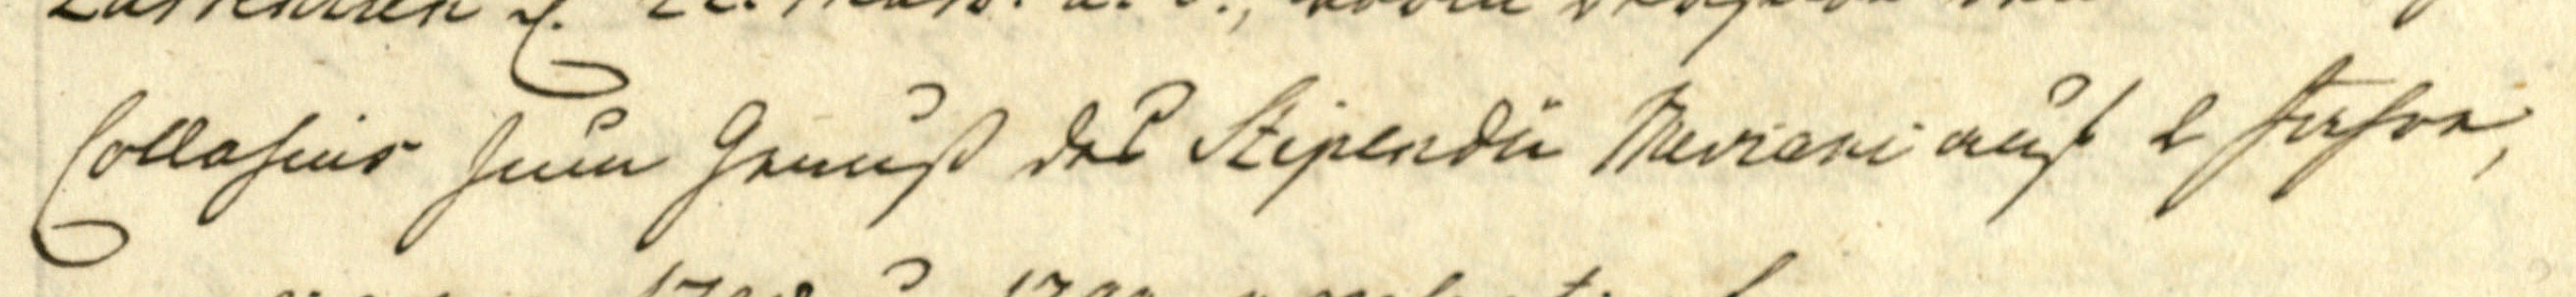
Collasius zum Genuß des Stipendii Meviani auf 2 Jahre,
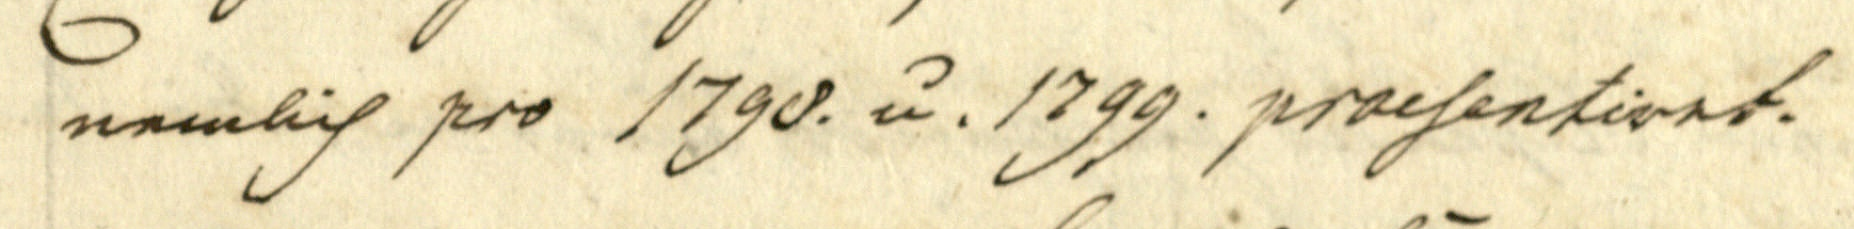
nemlich pro 1798. u. 1799. praesentiret.
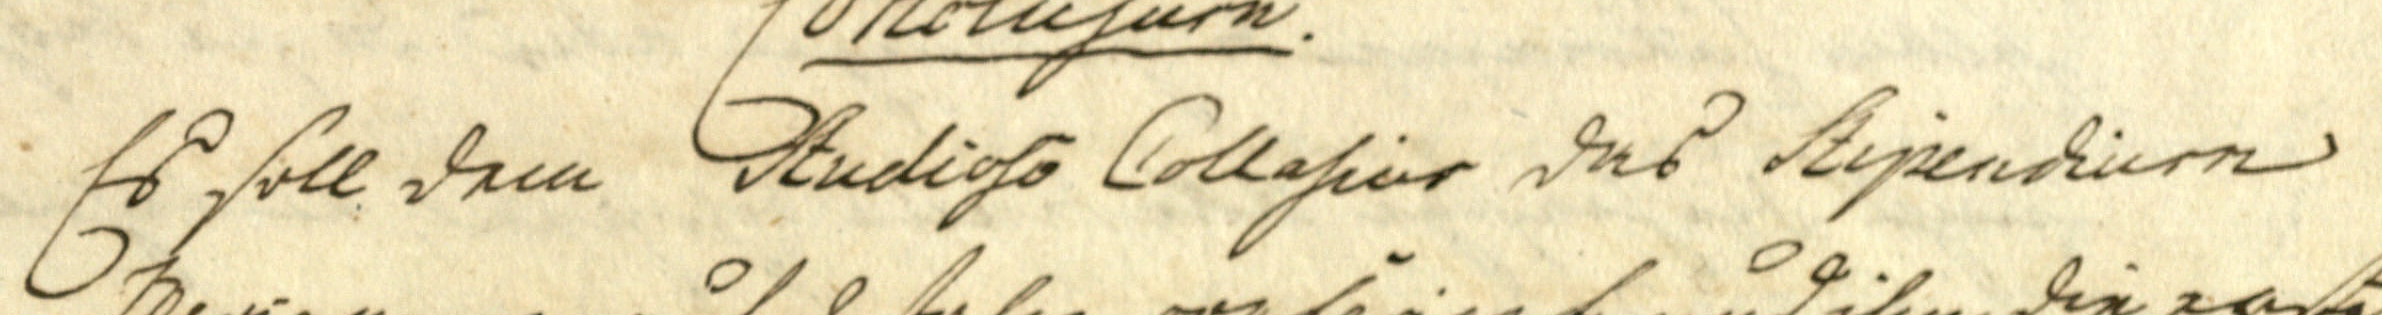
Es soll dem Studioso Collasius das Stipendium
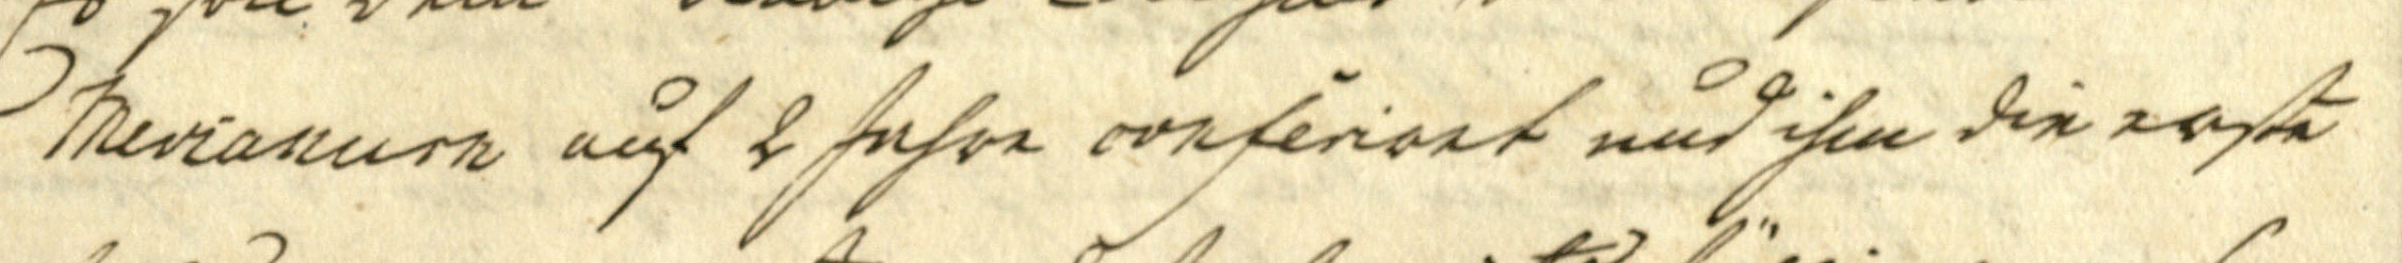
Mevianum auf 2 Jahre conferiret und ihm die erste
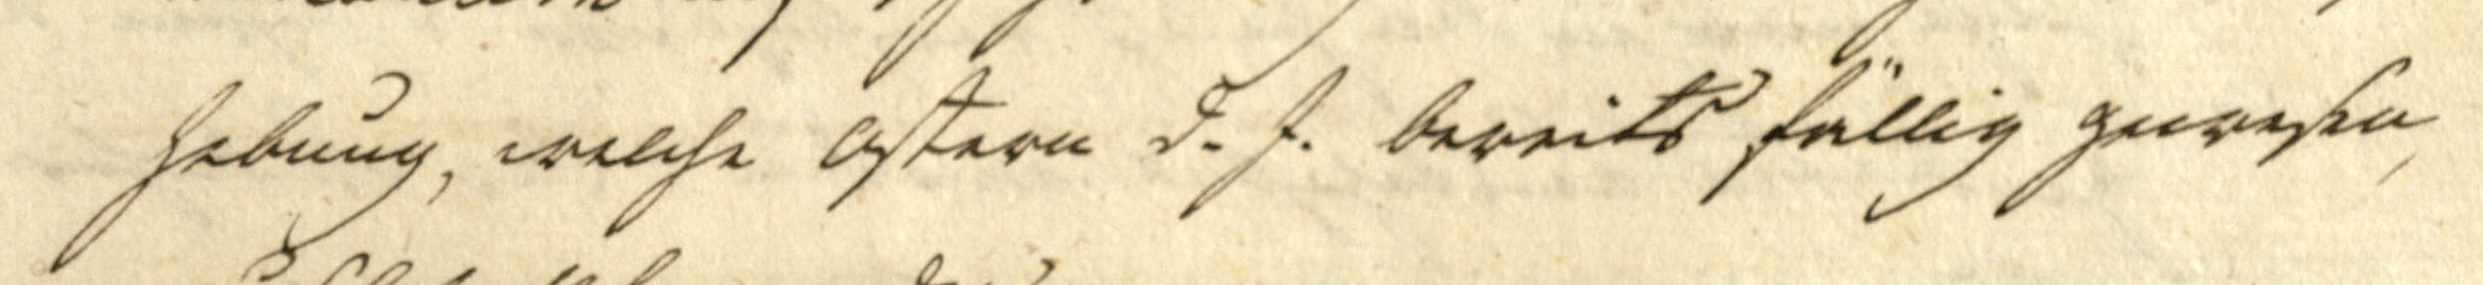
Hebung, welche Ostern d. J. bereits fällig gewesen,
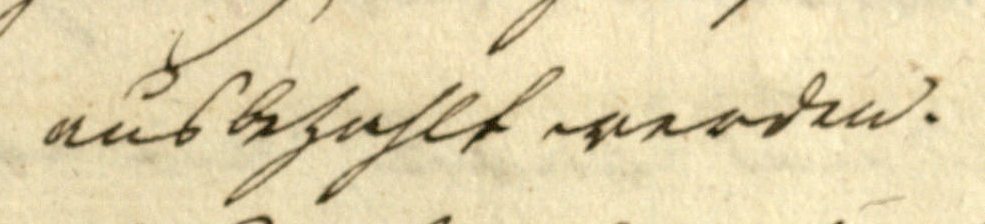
aus bezahlt werden.
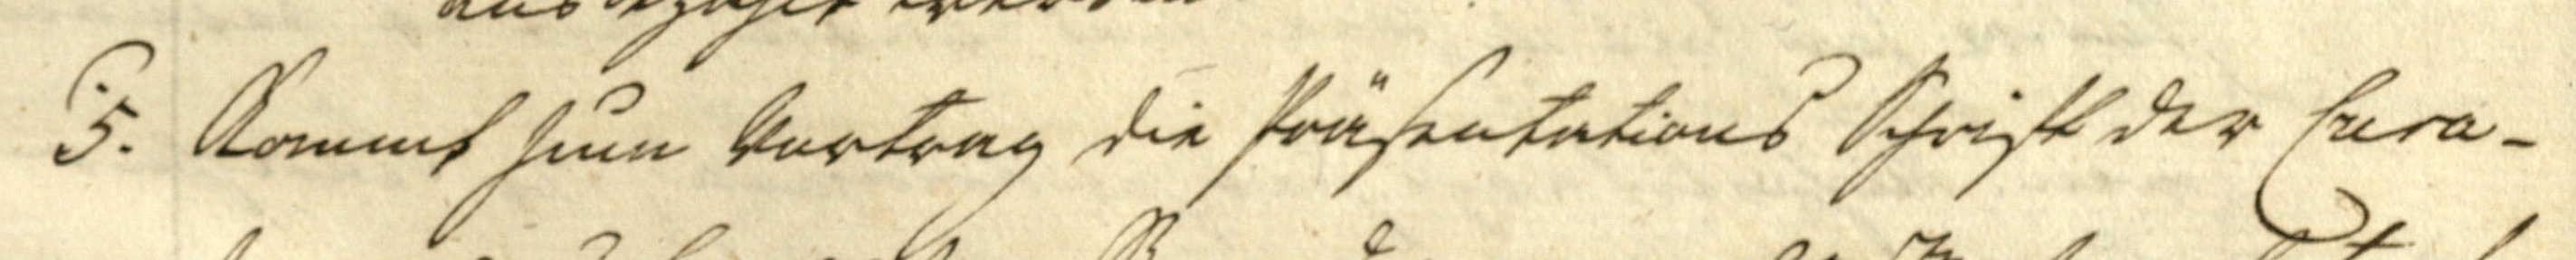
5. Kommt zum Vortrag die Präsentations Schrift der Cura¬
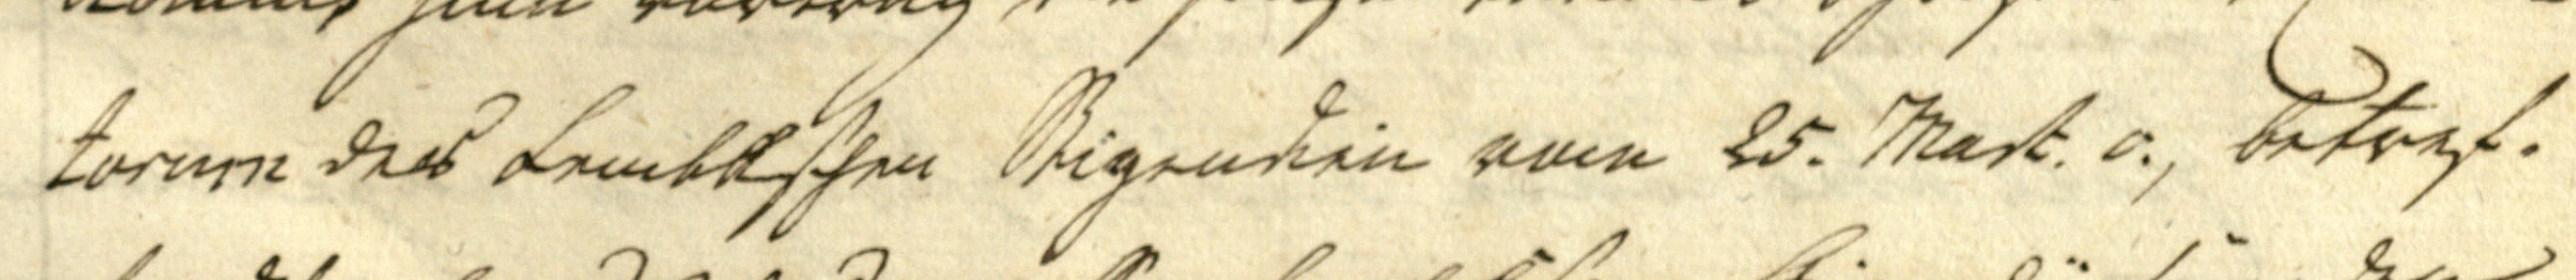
torum der Lembkschen Stipendien vom 25. Mart c. betref¬
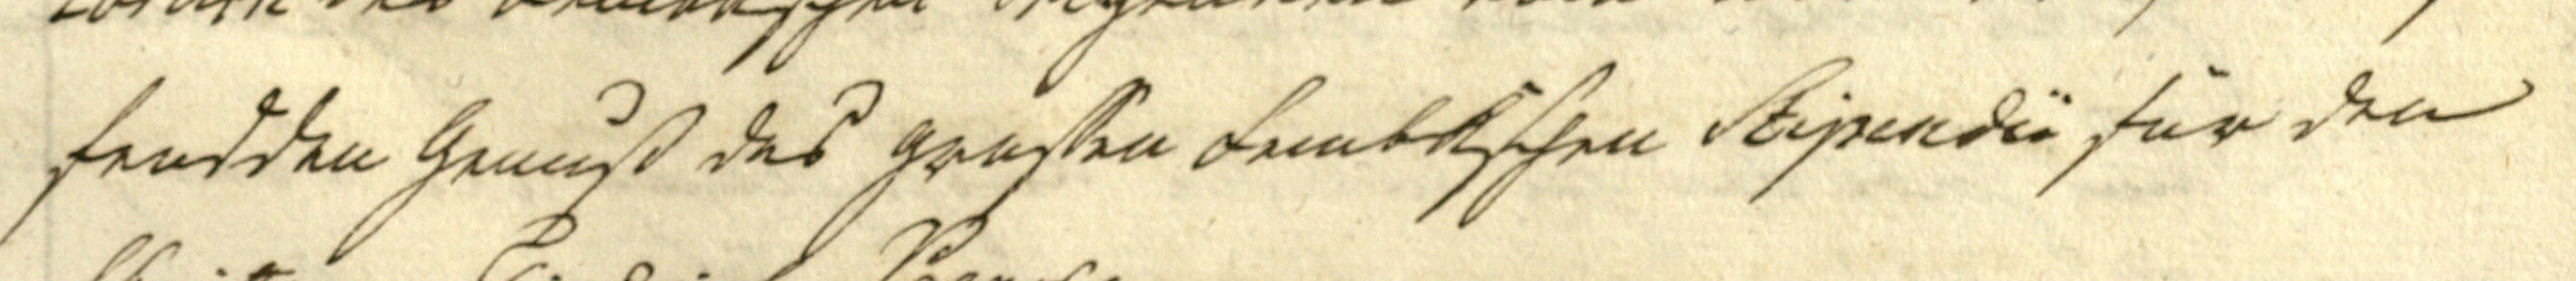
fend den Genuß des grossen Lembkschen Stipendii für den
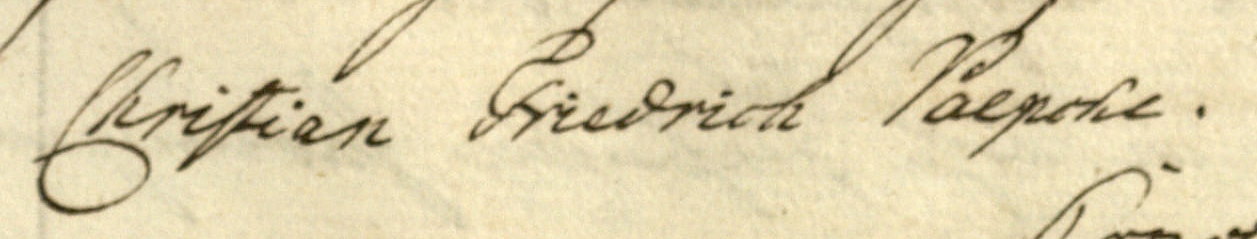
Christian Friedrich Paepcke.
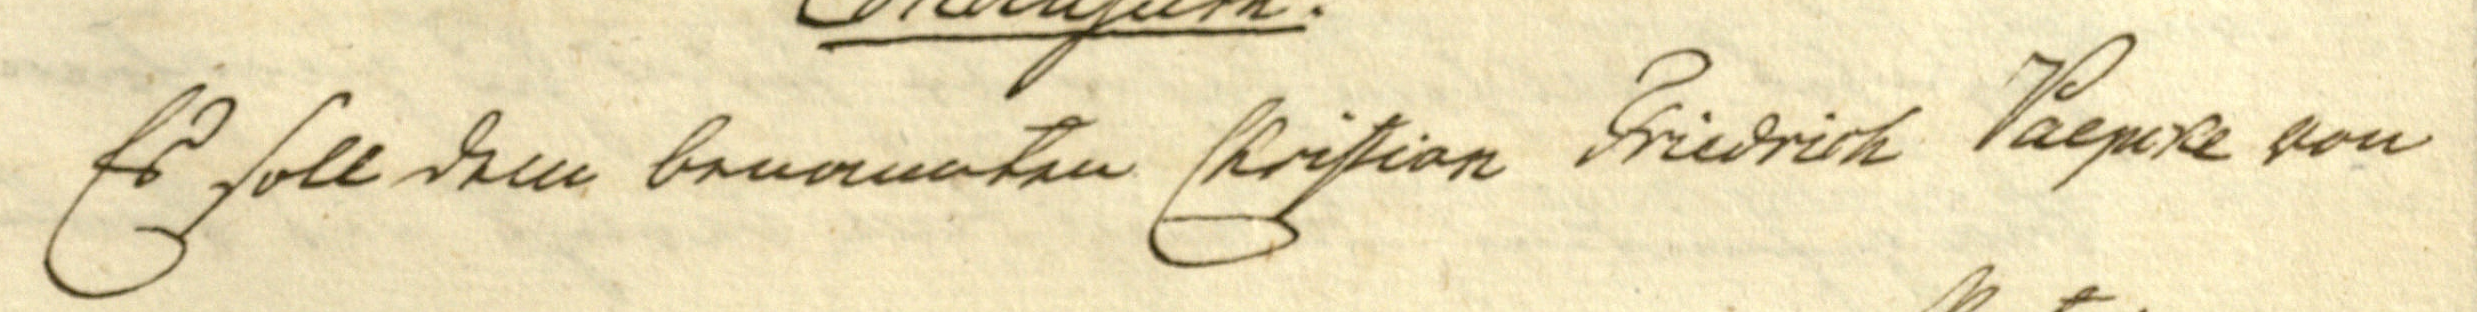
Es soll dem benannten Christian Friedrich Paepcke von
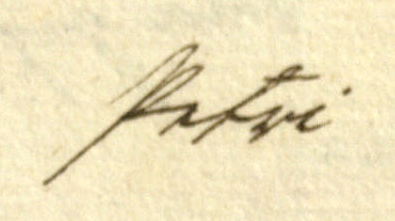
Petri
